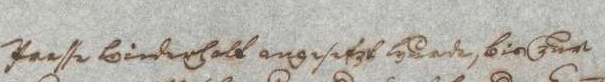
Presse wiederholt angesetzt wurde, bis zur
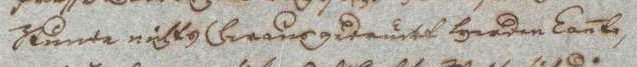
Stunde nichts herausgedrückt werden konnte,
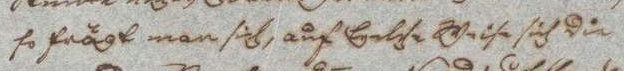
so frägt man sich, auf welche Weise sich die
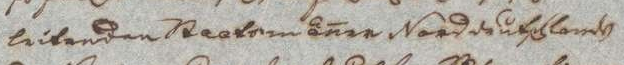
leitenden Staatsmänner Norddeuschlands
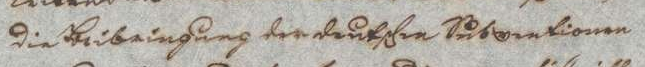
die Beibringung der deutschen Subventionen
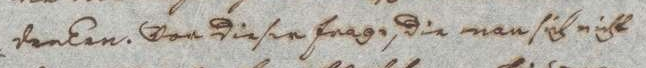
denken. Vor dieser Frage, die man sich nicht
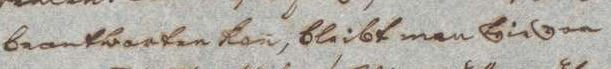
beantworten kann, bleibt man wie vor
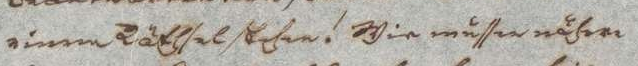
einem Räthsel stehen! Wir müssen nähere
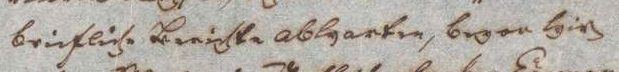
briefliche Berichte abwarten, bevor wir
